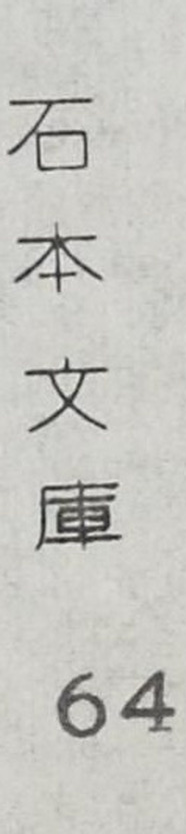石本文庫

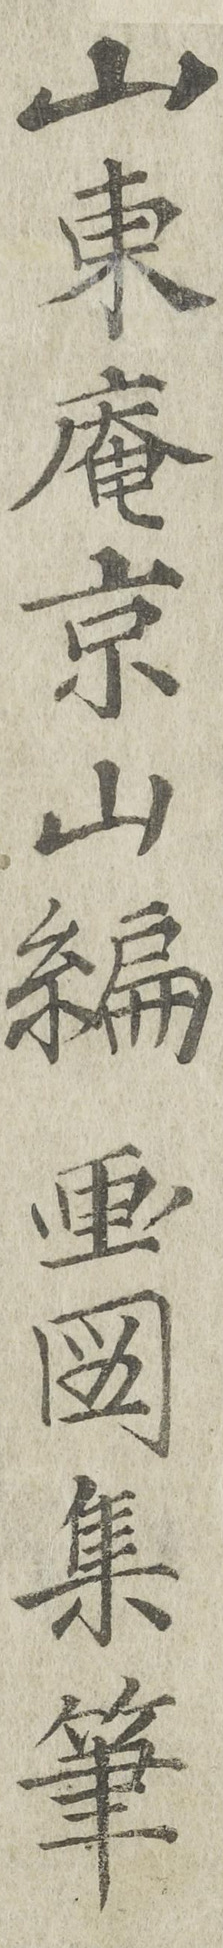山東庵京山編画図集筆
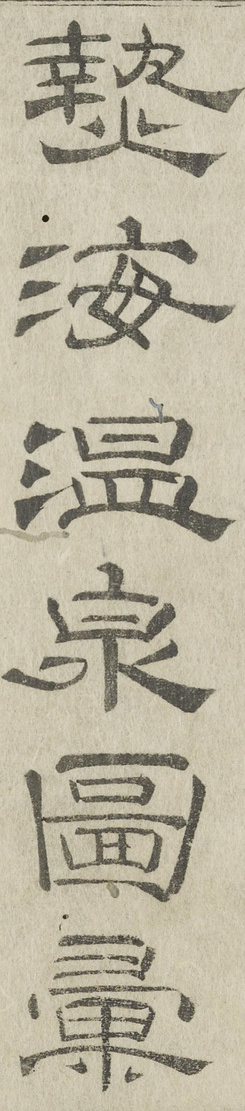熱海温泉図彙
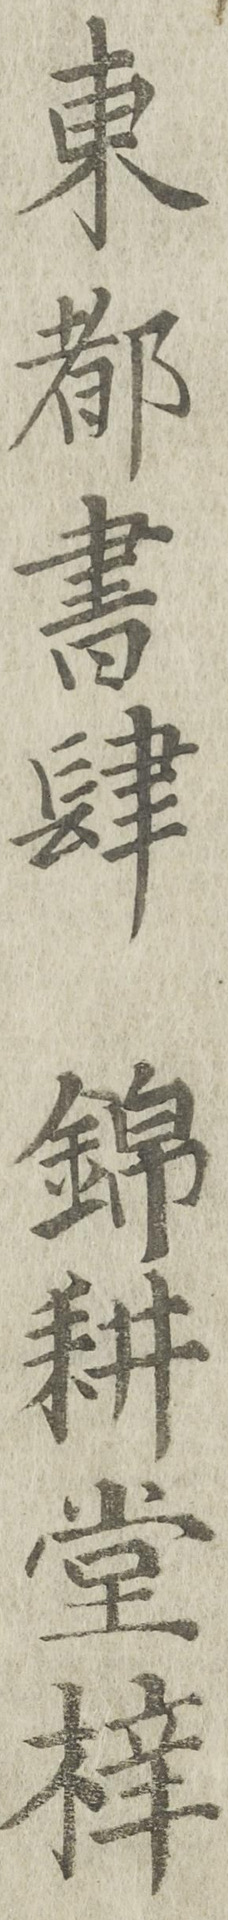東都書肆錦耕堂梓
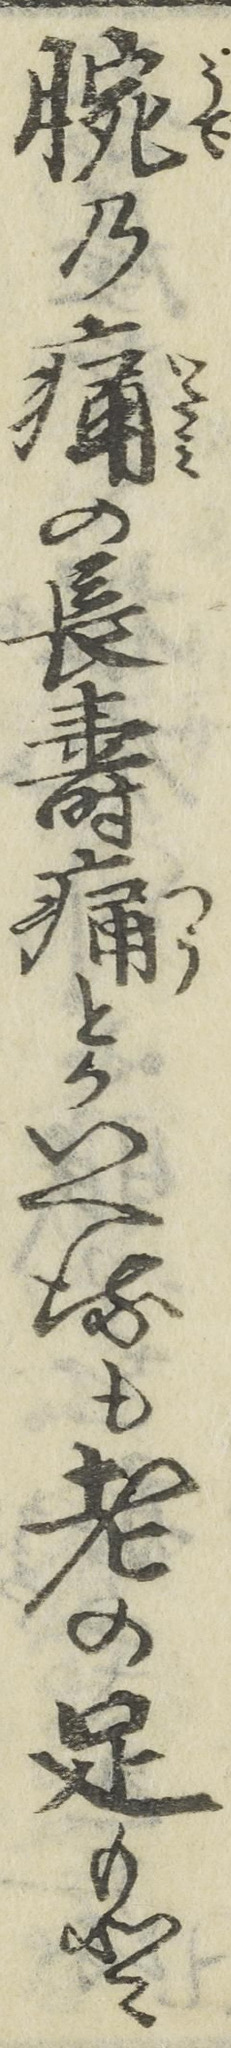腕の痛の長寿痛とかいへるも老の足もと
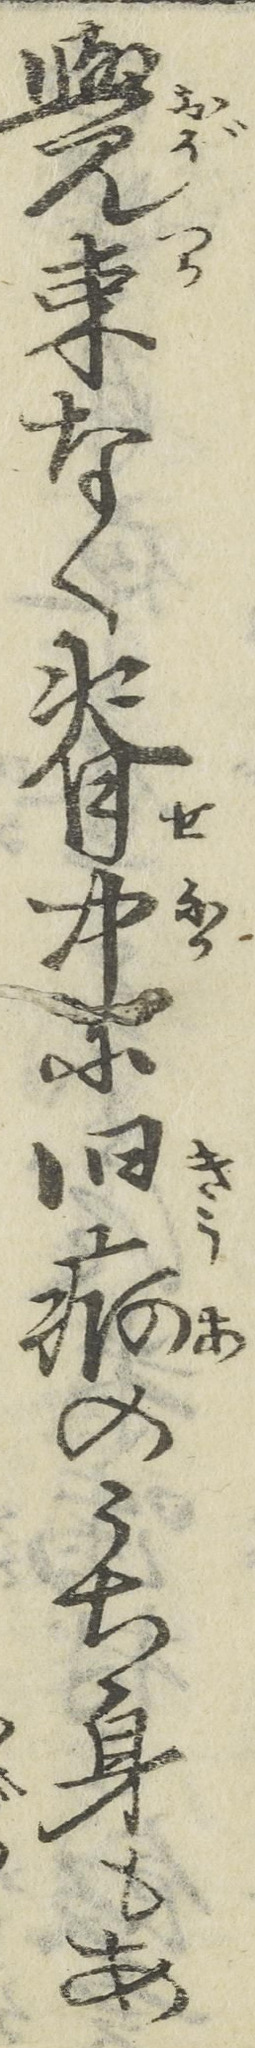覚束なく背中に旧痾のうち身もあ
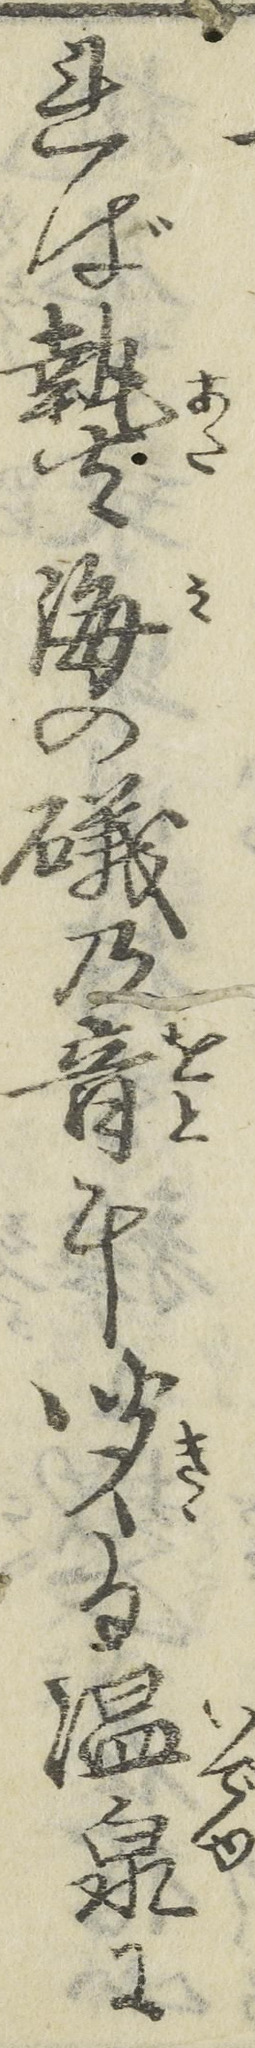れば熱海の磯の音に聞たる温泉に
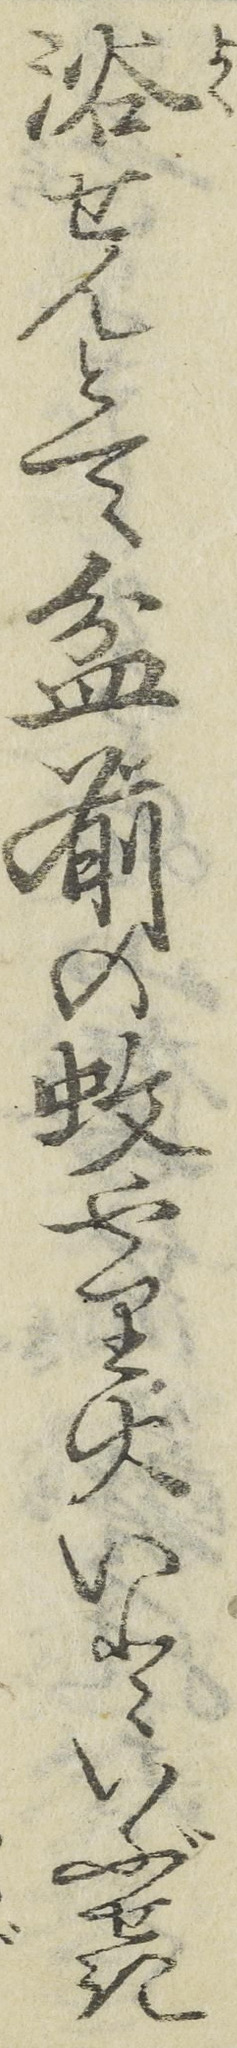浴せんとて盆前の蚊やり火いといぶせき
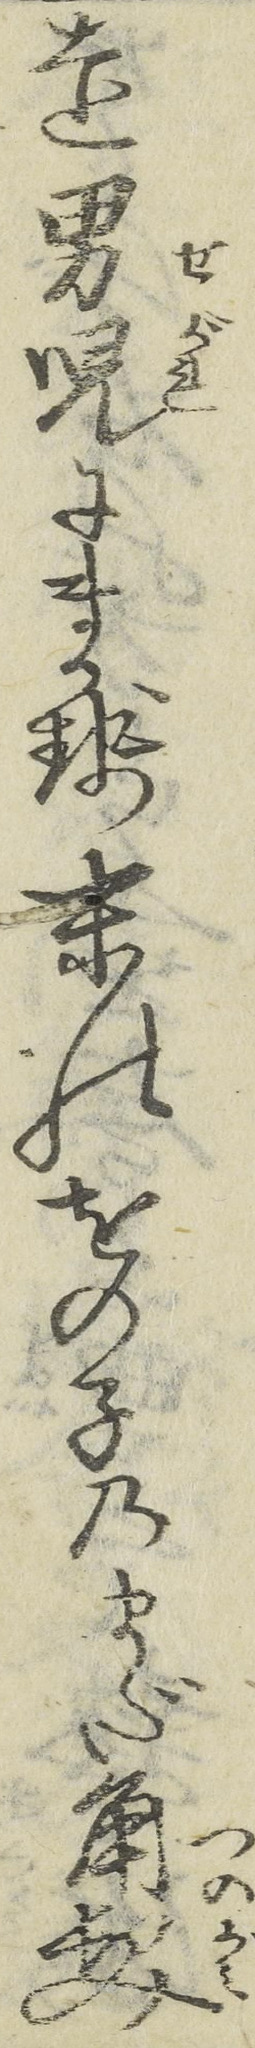を男児にまかせ末のをの子のまだ角髪
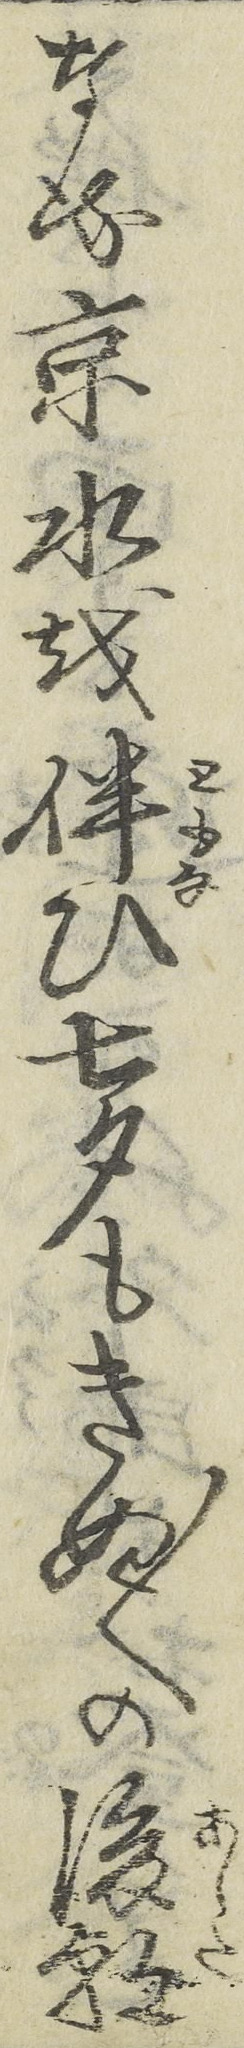なる京水を伴ひ七夕もきぬ〳〵の後朝
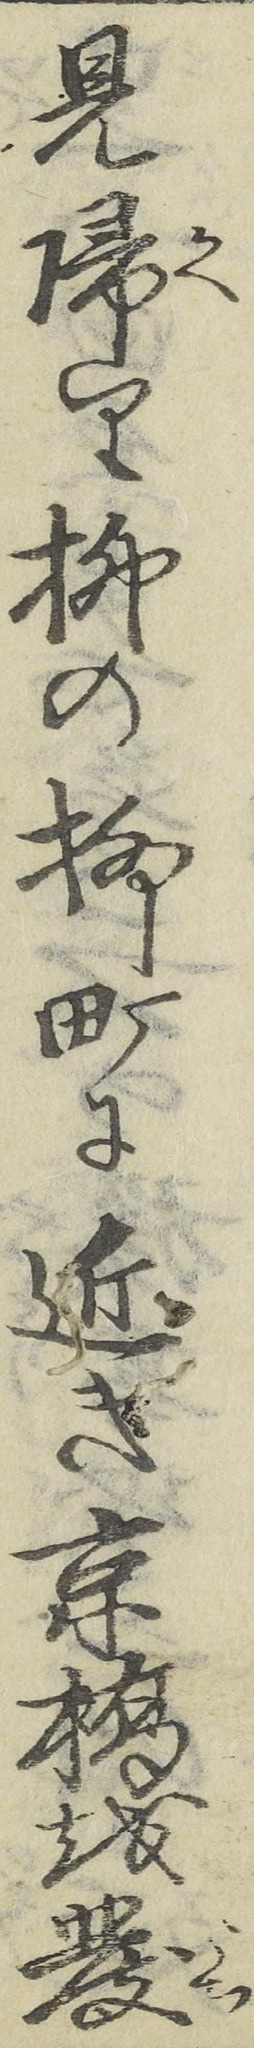見帰り柳の柳町に近き京橋を発

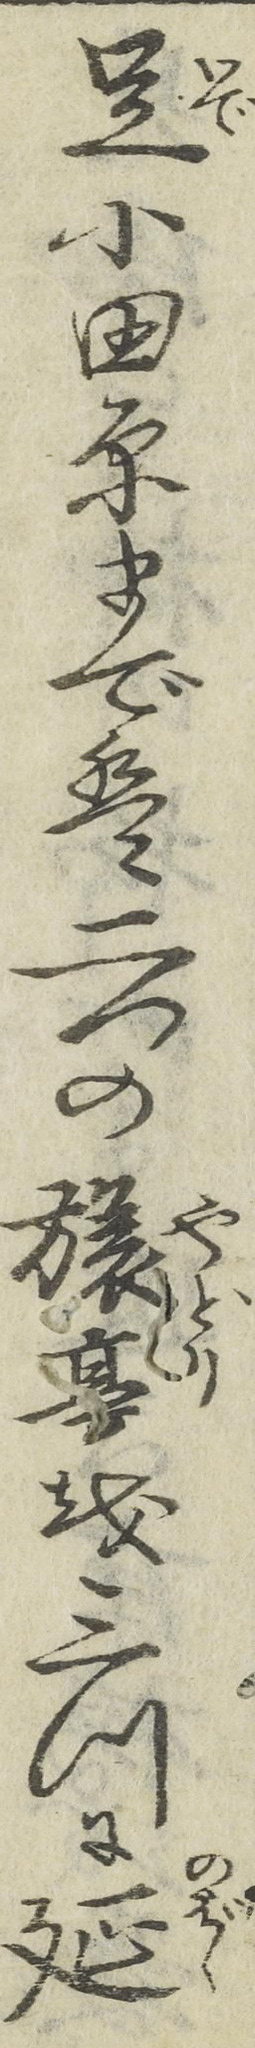足小田原までは二つの旅亭を三つに延
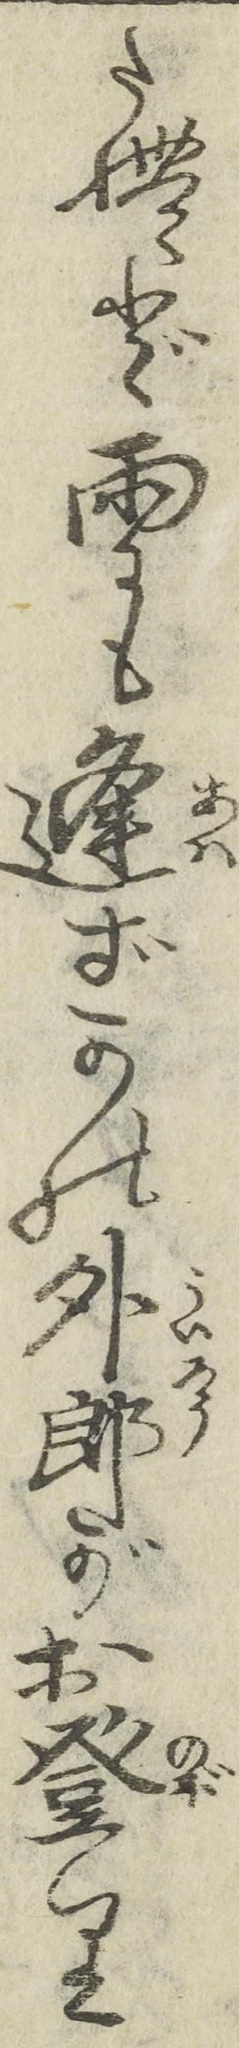たれど雨にも逢ずかの外郎がお登り
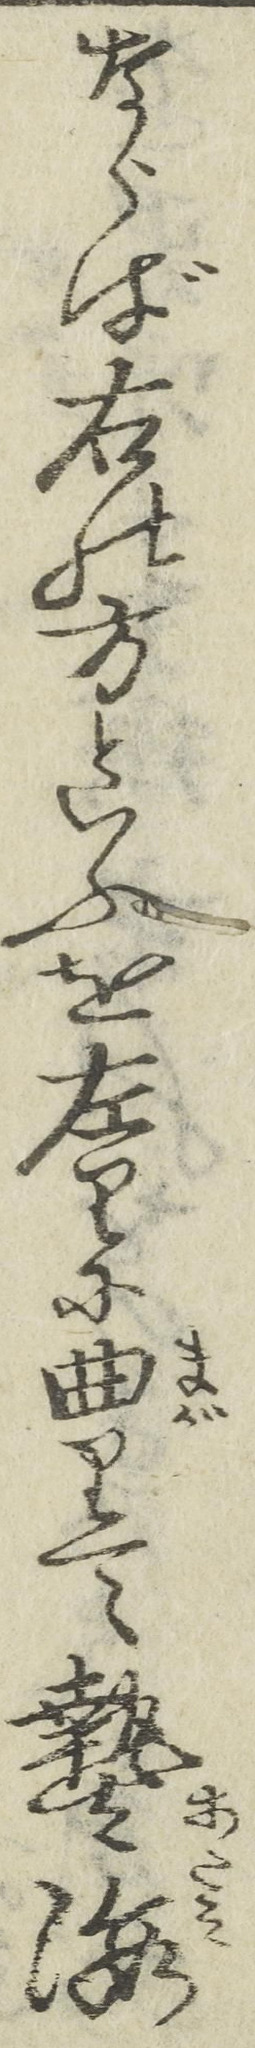ならば右の方といふを左りに曲りて熱海
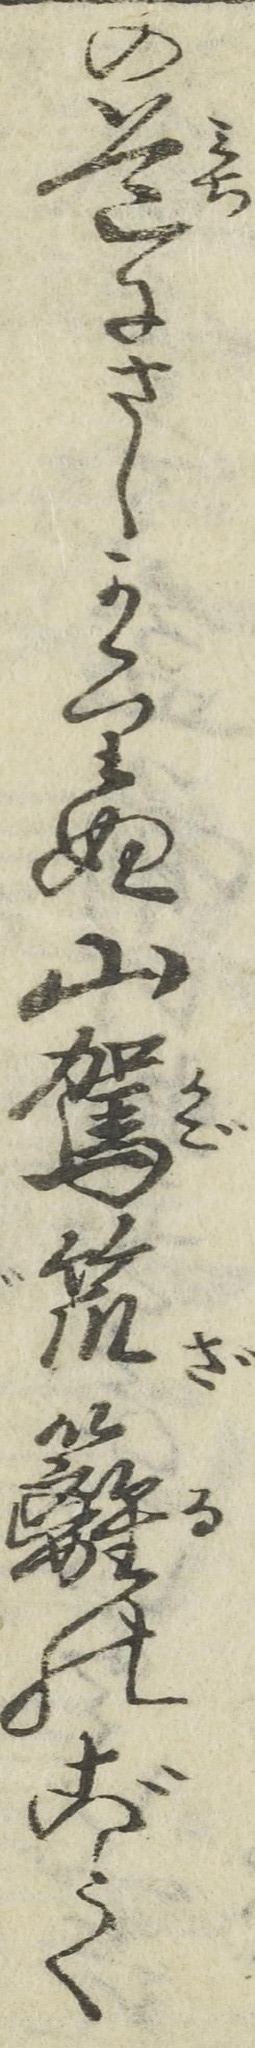の道にさしかゝりぬ山駕笊籬のごとく
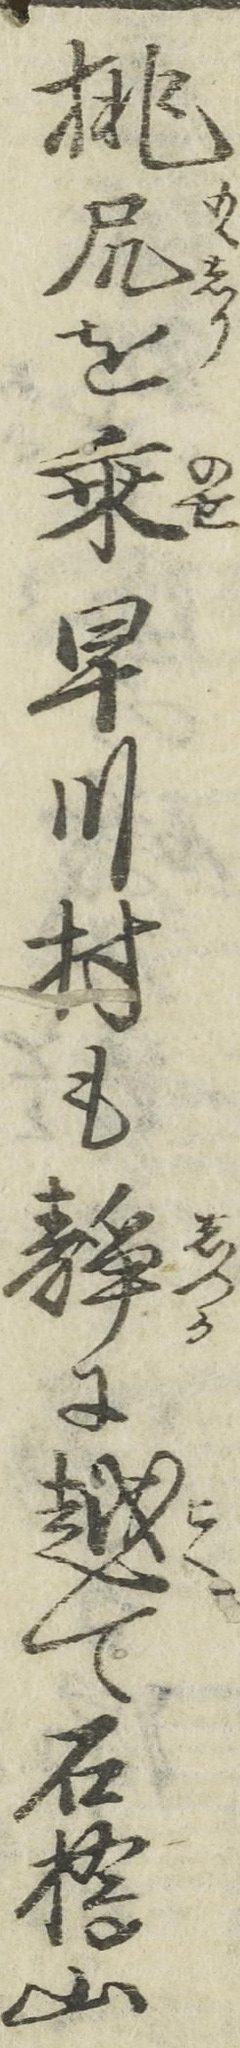桃尻を乗早川村も静に越て石橋山
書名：熱海温泉圖彙
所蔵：東京大学地震研究所図書室 Earthquake Research Institute Library, The University of Tokyo, JAPAN
